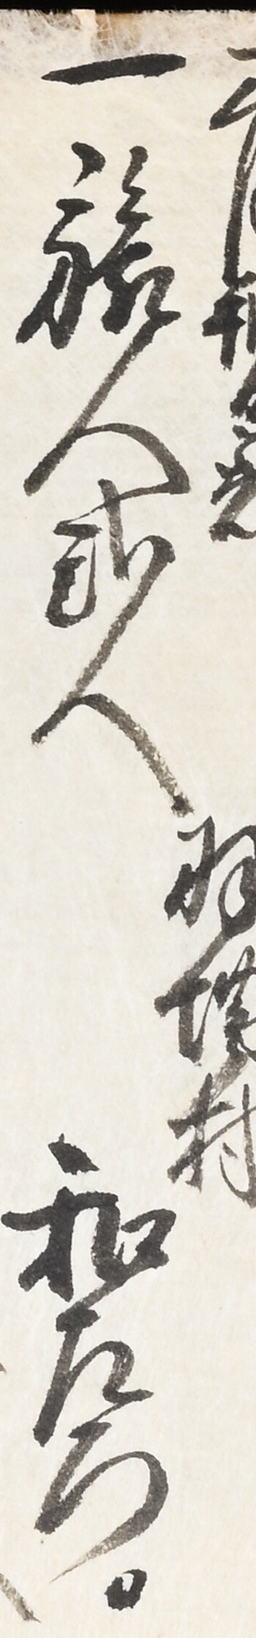一旅人弐人和左衛門。
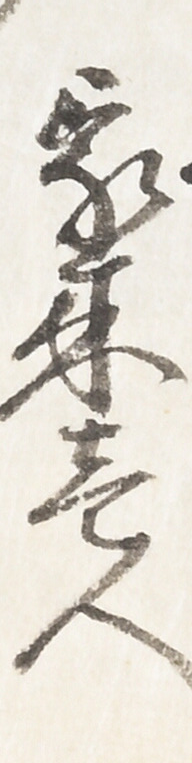家来壱人
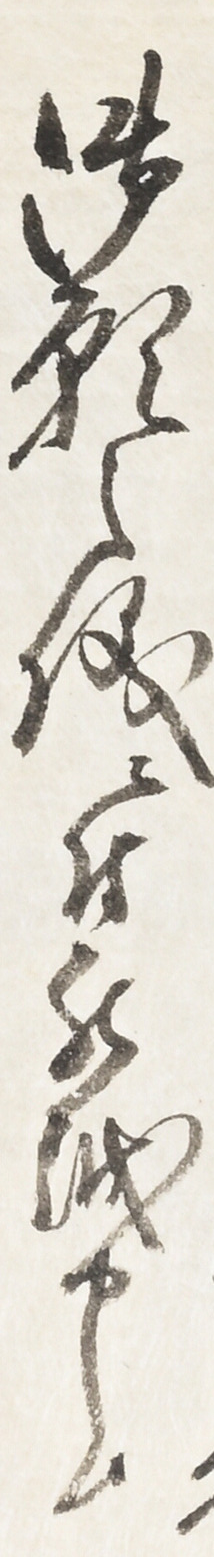御願之義ニ付罷越申候
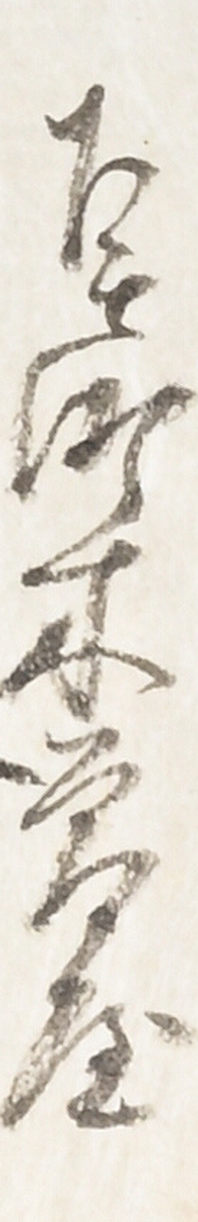下モ町木曽屋
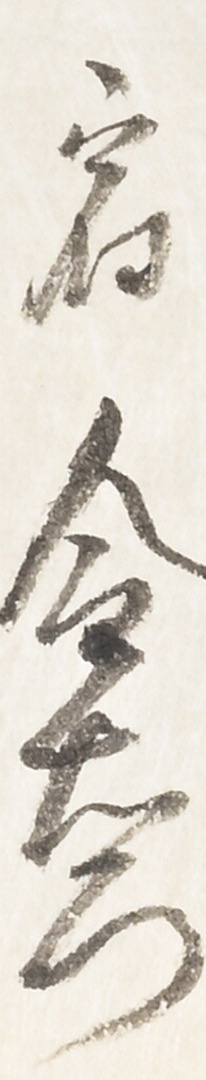宿金右衛門
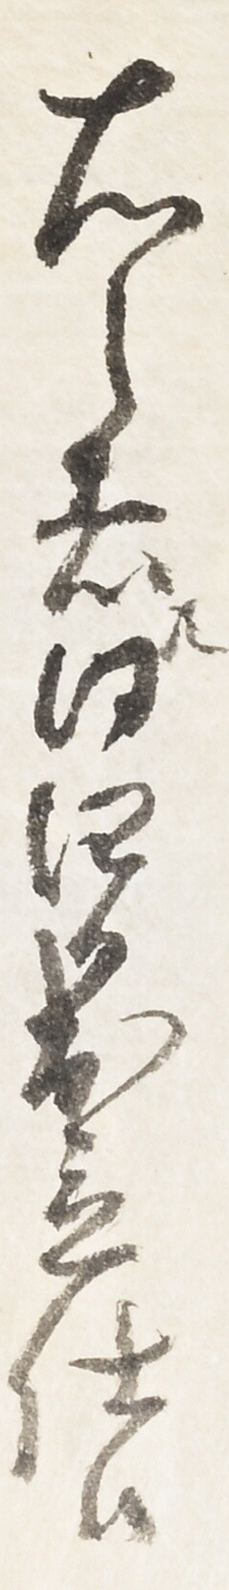右之者同十一日出立仕候
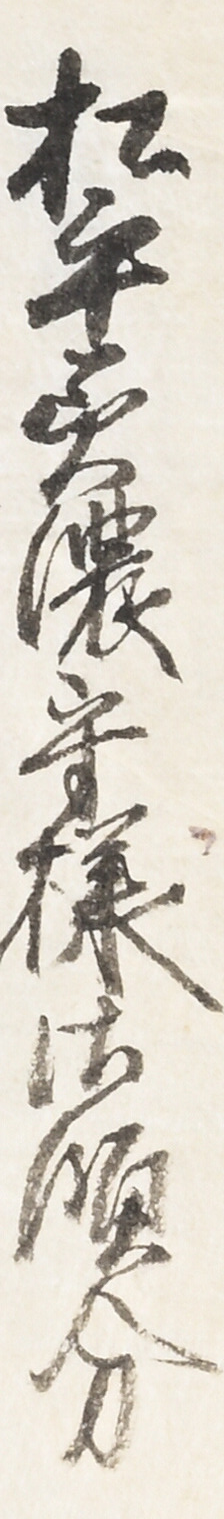松平美濃守様御領分
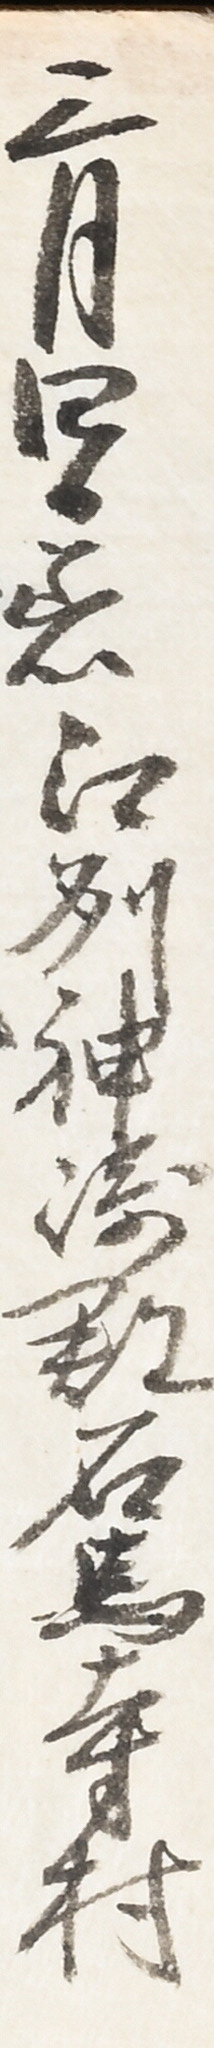三月四日着江州神崎郡石馬寺村
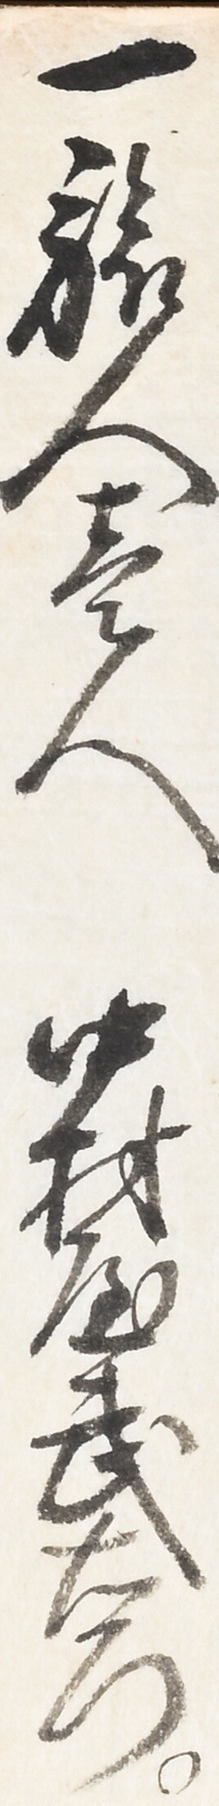一旅人壱人中村屋武右衛門。
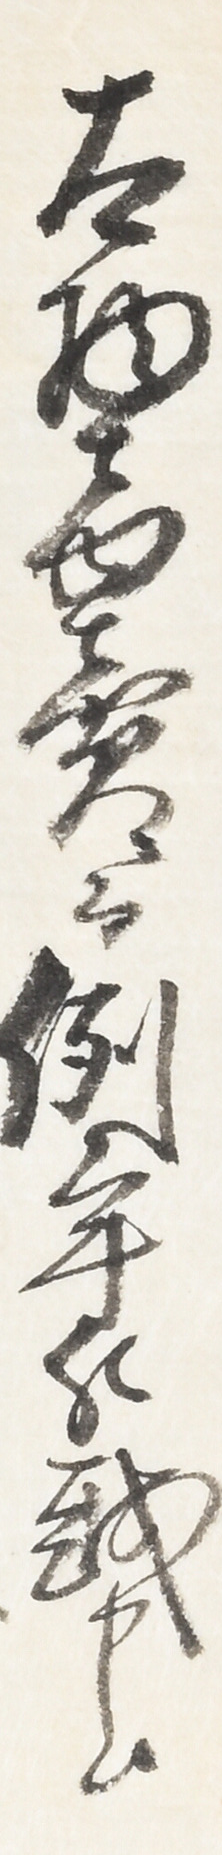太物商売ニ而例年罷越申候
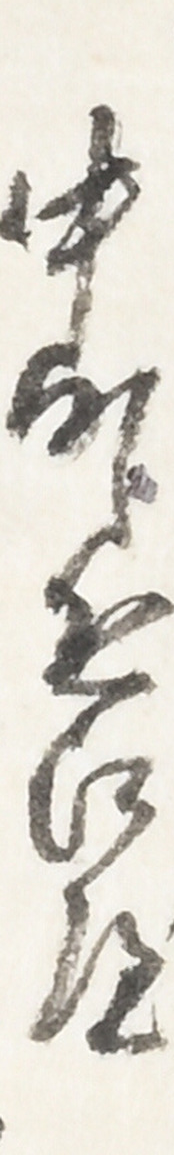中町近江屋
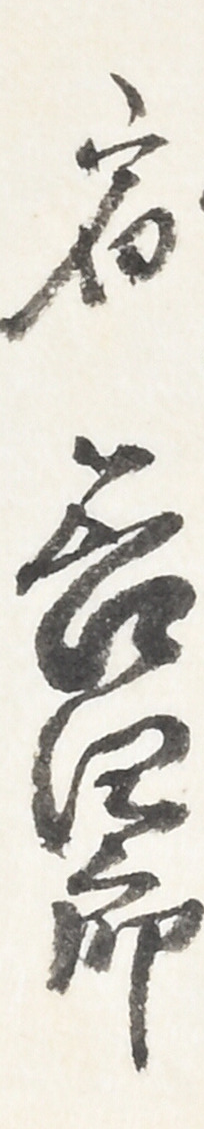宿善四郎
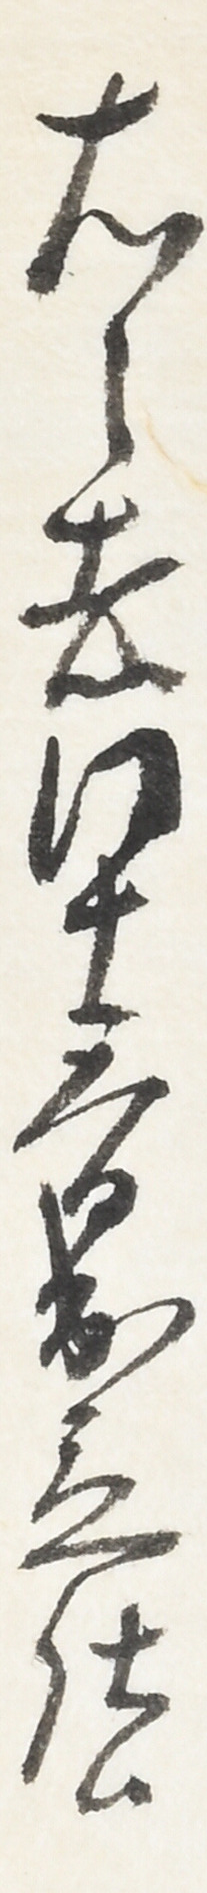右之者同十一日出立仕候
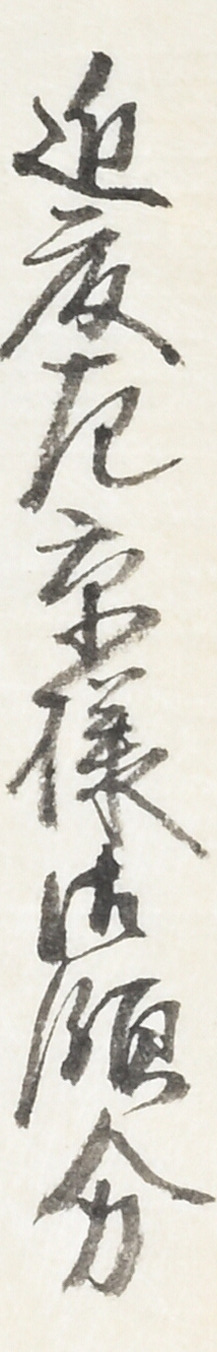近藤左京様御領分
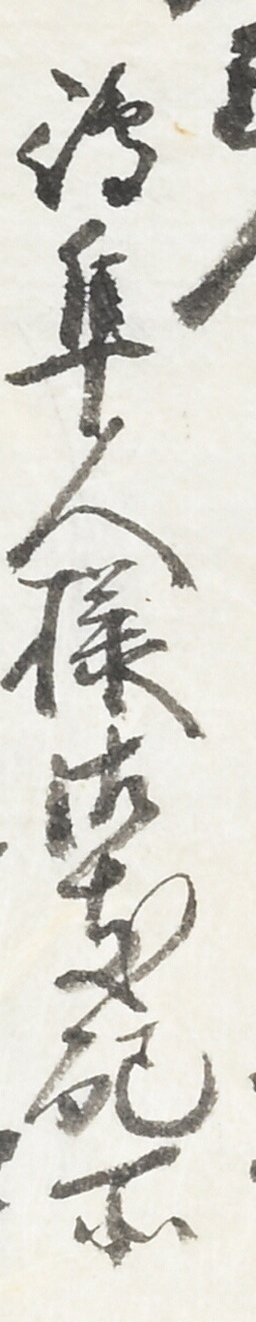嶋隼人様御支配所
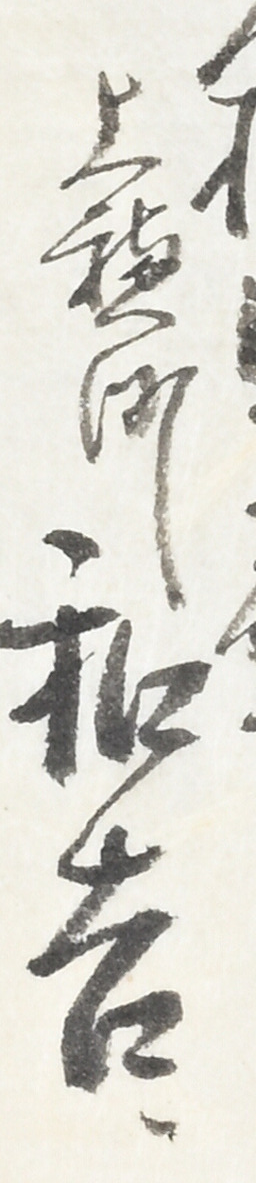上穂町和吉・
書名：旅人泊控帳
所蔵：伊那市立高遠町図書館・合同会社AMANE
